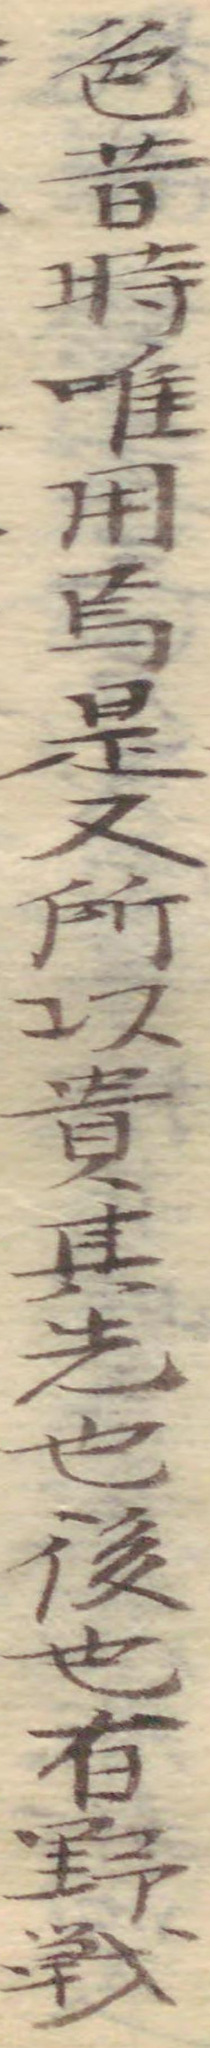色昔時唯用焉是又所以貴其先也後也有野戦
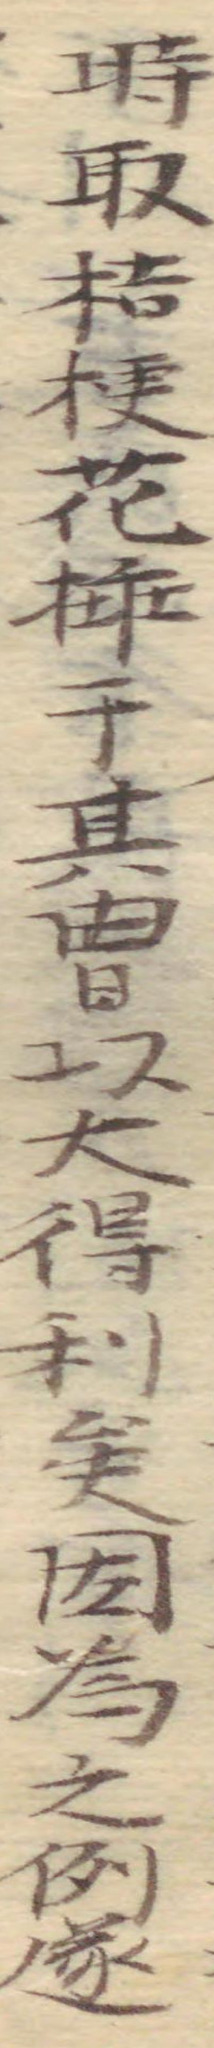時取桔梗花挿于其冑以大得利矣因為之例遂
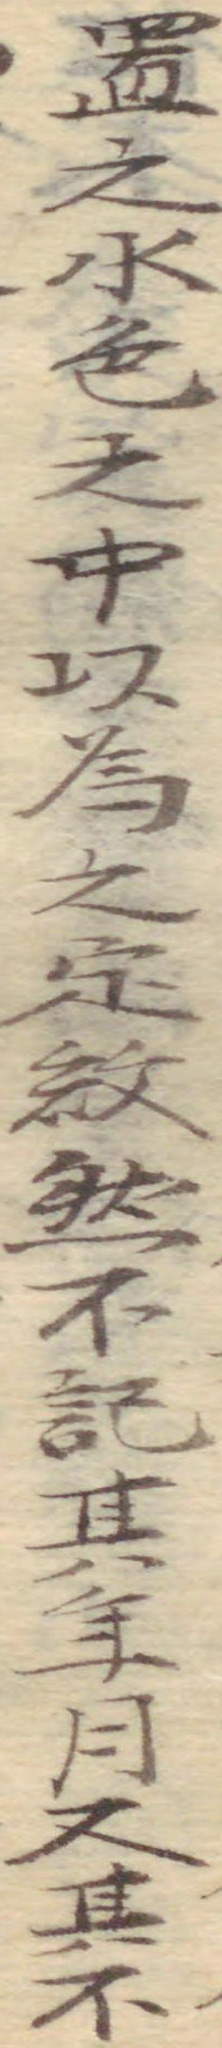置之水色之中以為之定紋然不記其年月又其不
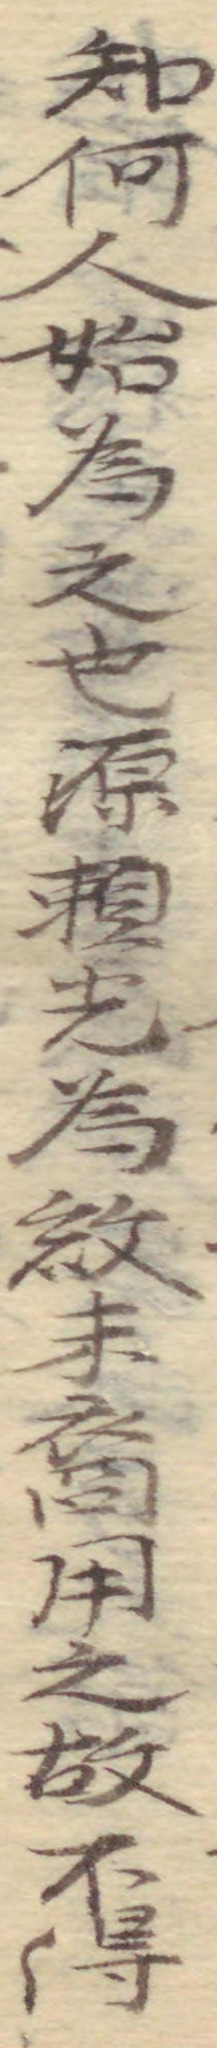知何人始為之也源頼光為紋末裔用之故不得
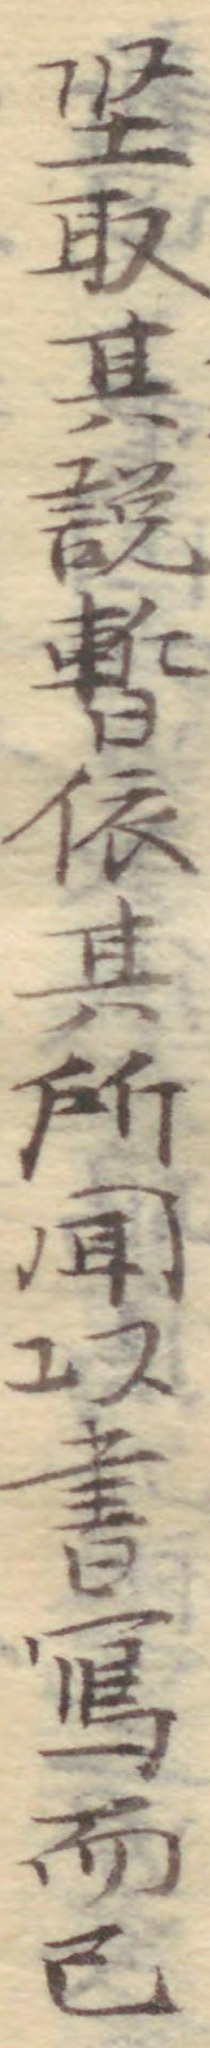堅取其説暫依其所聞以書寫而已
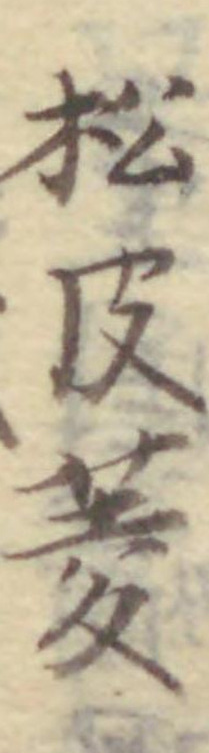松皮菱
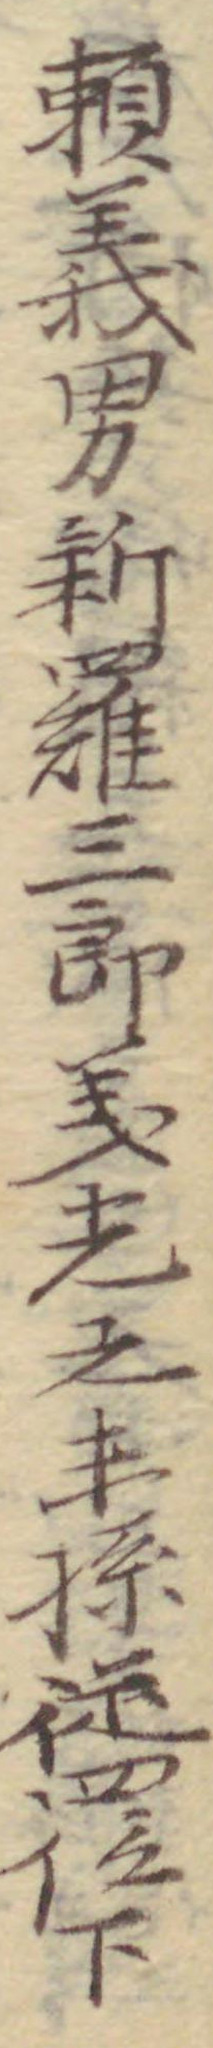頼義男新羅三郎義光之末孫従四位下
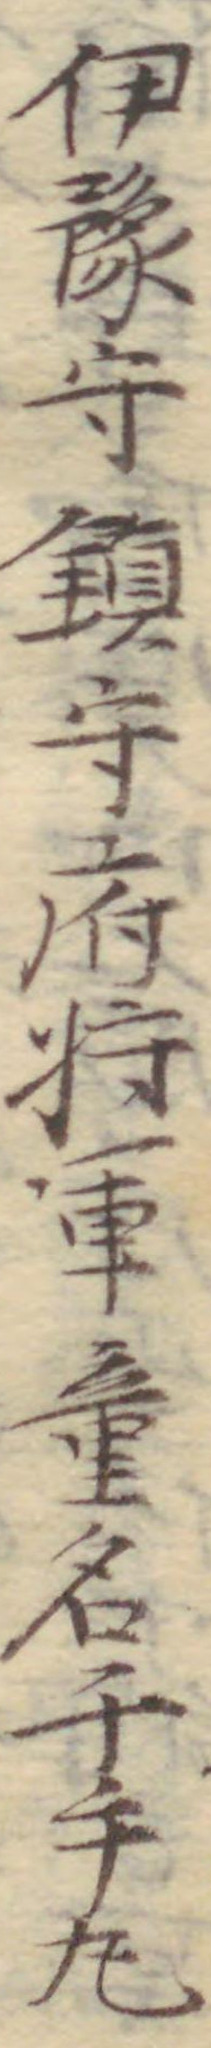伊予守鎮守府将軍童名千手丸
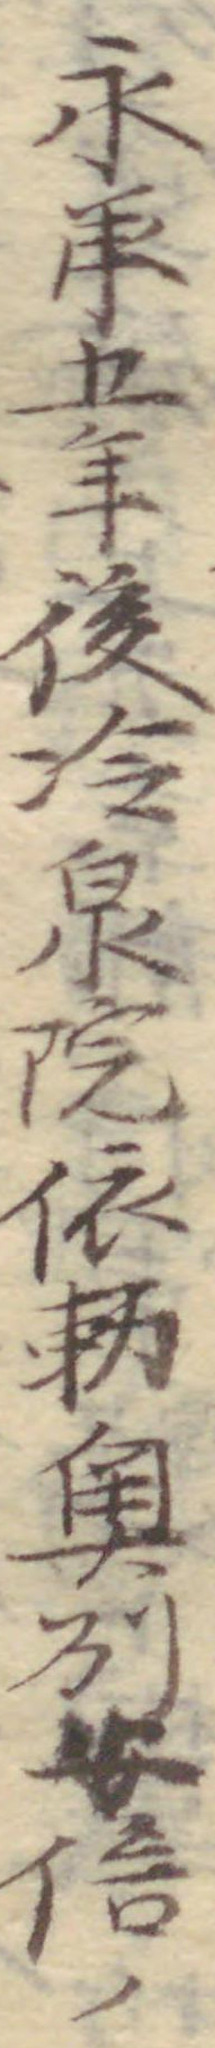永承五年後冷泉院依勅奥州安倍ノ
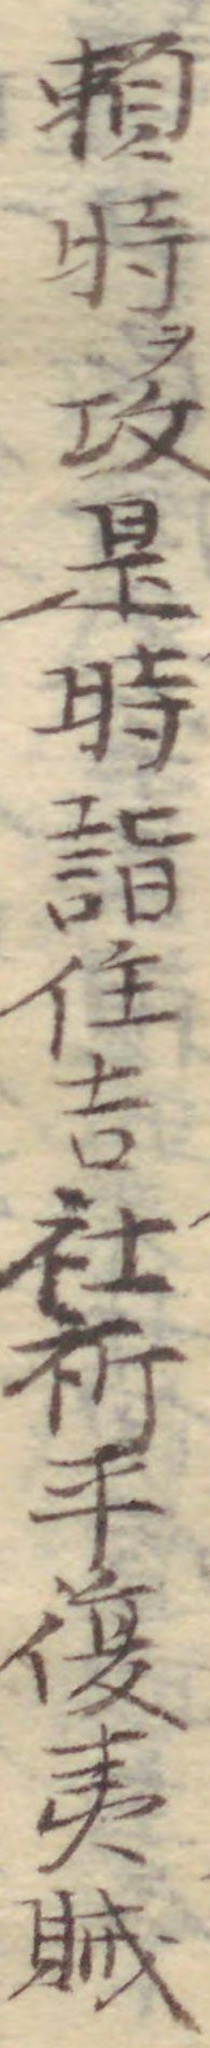頼時攻是時詣住吉社祈平復夷賊
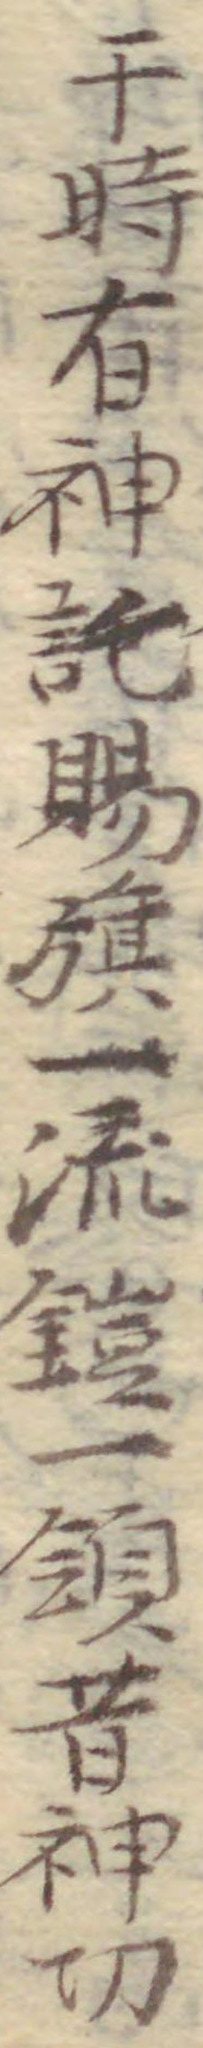于時有神託賜旗一流鎧一領昔神功
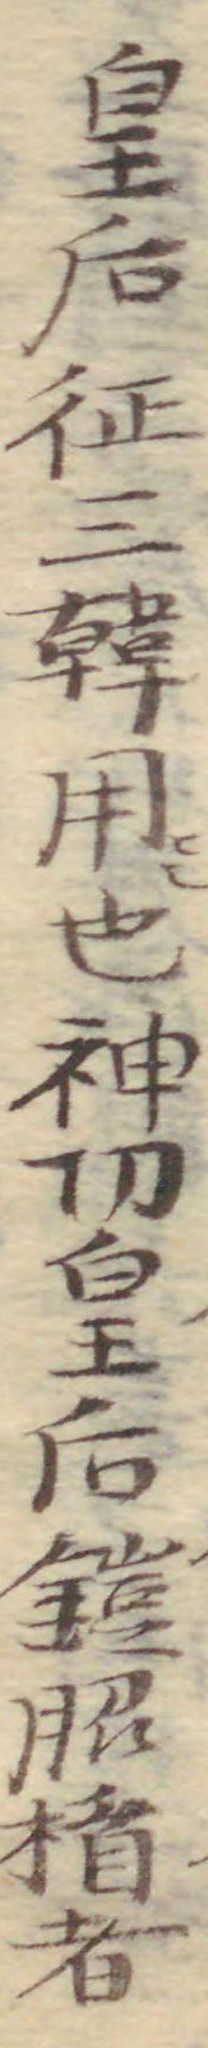皇后征三韓用也神功皇后鎧脇楯者
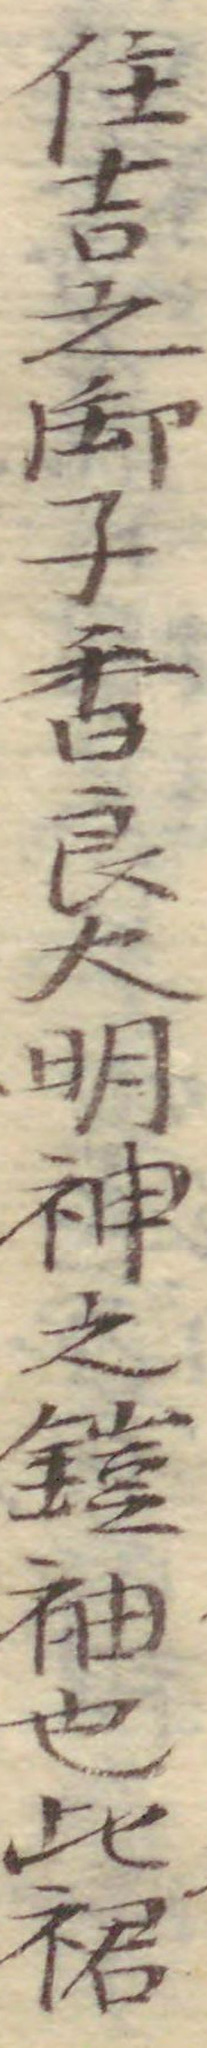住吉之御子香良大明神之鎧袖也此裙
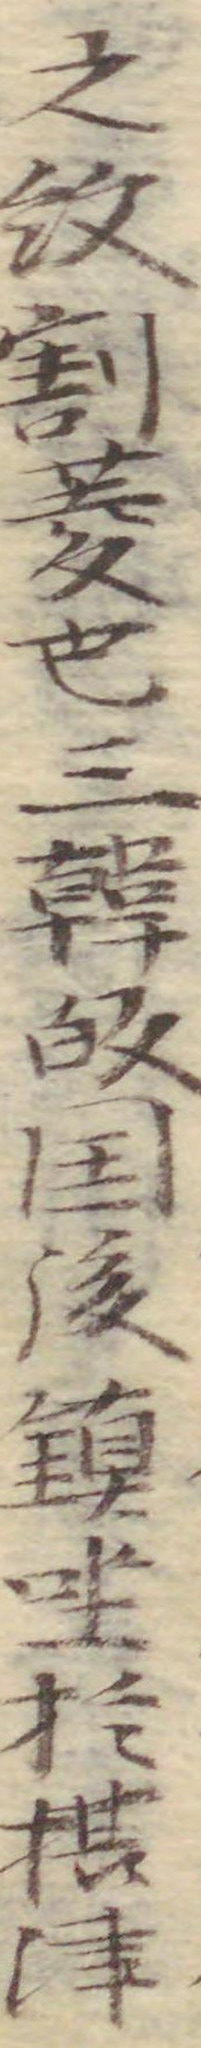之紋割菱也三韓皈国後鎮坐於攝津
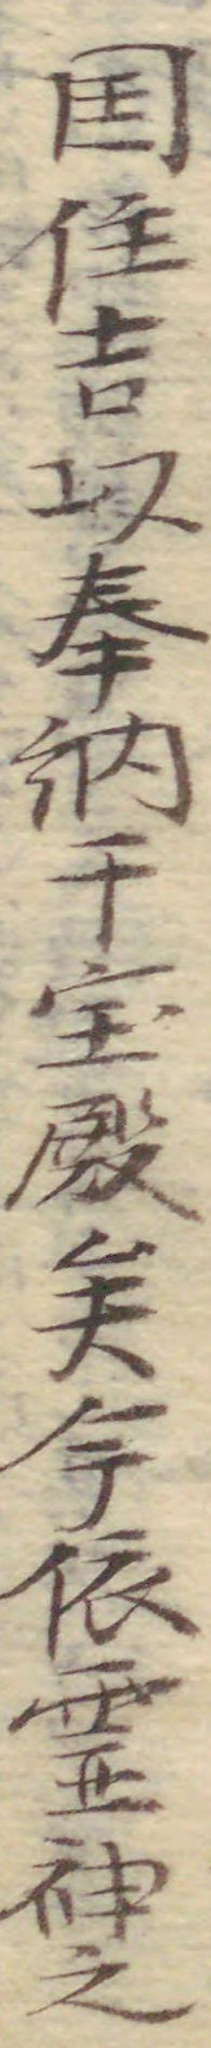国住吉以奉納于宝殿矣今依霊神之
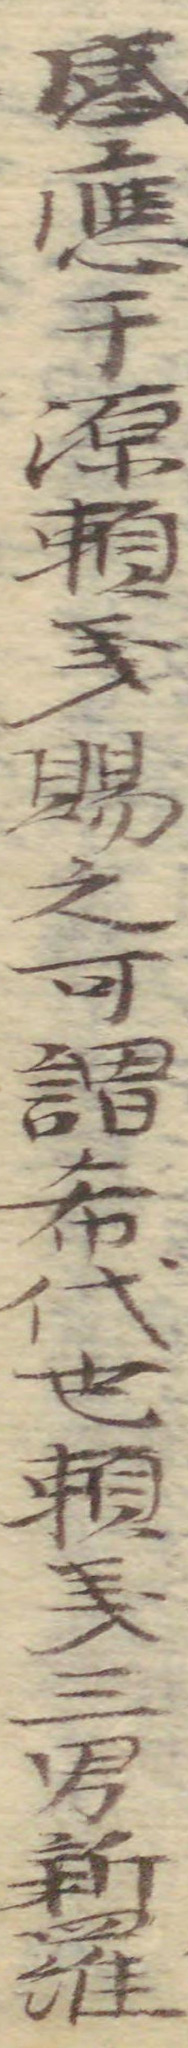感応于源頼義賜之可謂希代世頼義三男新羅
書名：鶯宿雑記. 巻199-200
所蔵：国立国会図書館 National Diet Library, JAPAN
